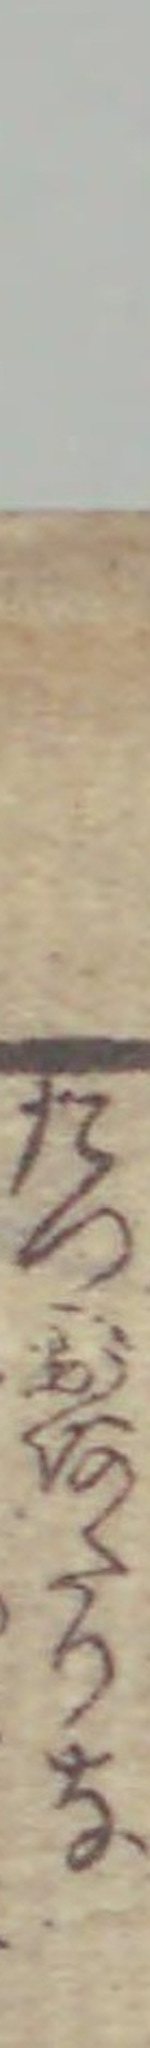たつへおあたりな
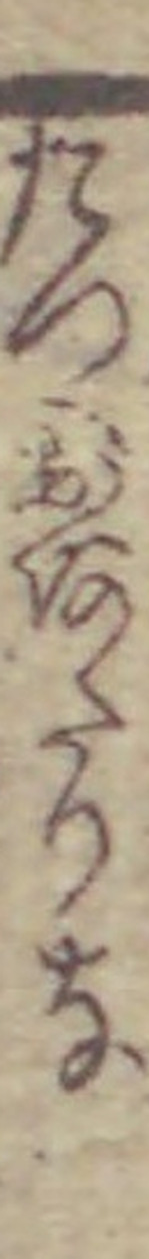たつへおあたりな
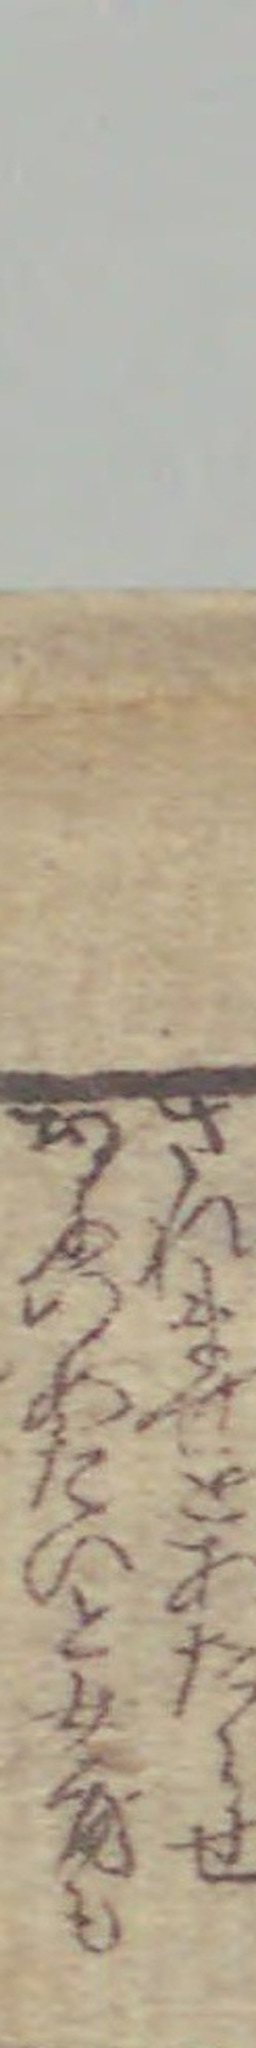おふつめたいと女房も

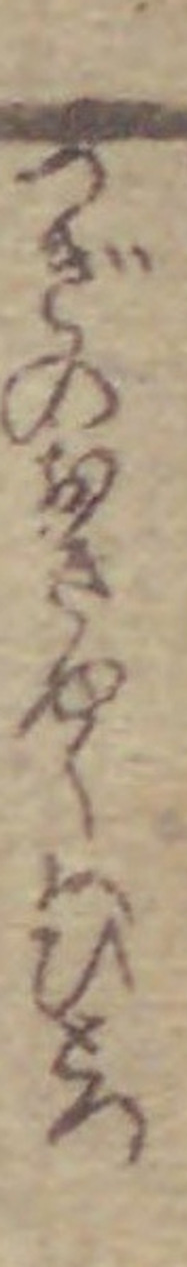つぎのおきやくはひとつ
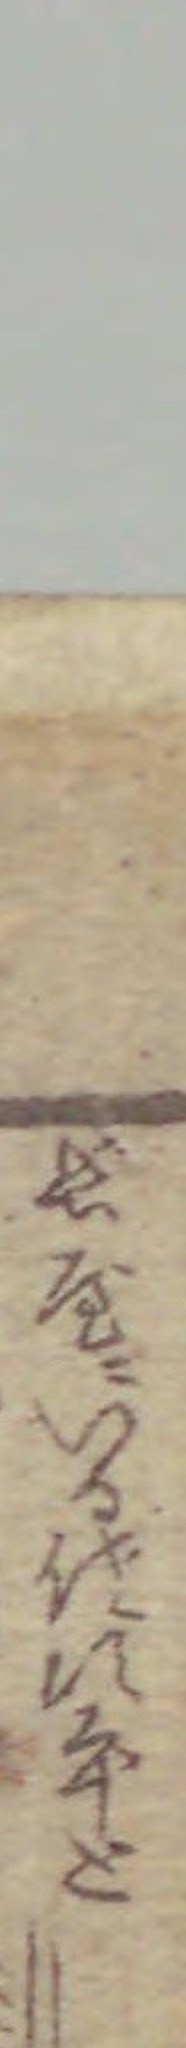長屋にいる佐次平と
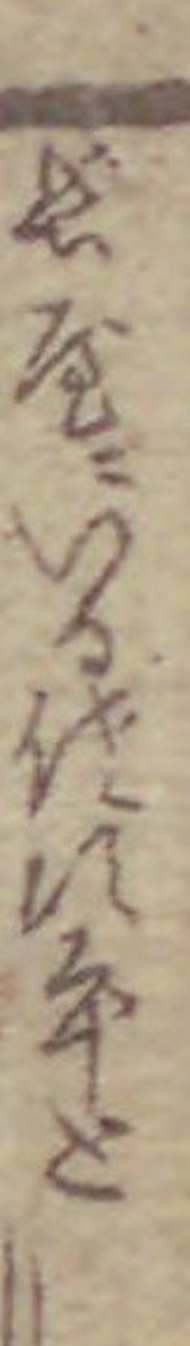長屋にいる佐次平と
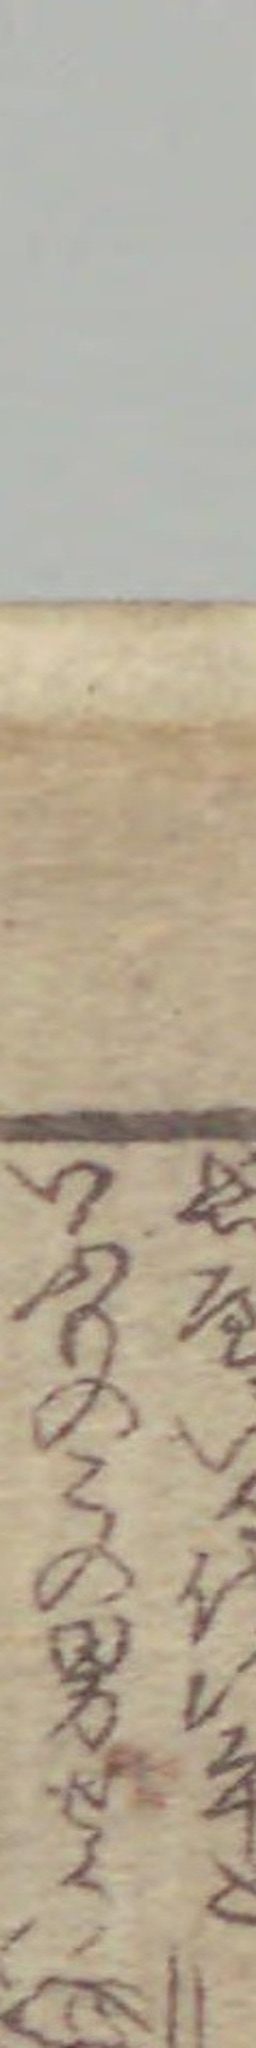いふものこの男せう
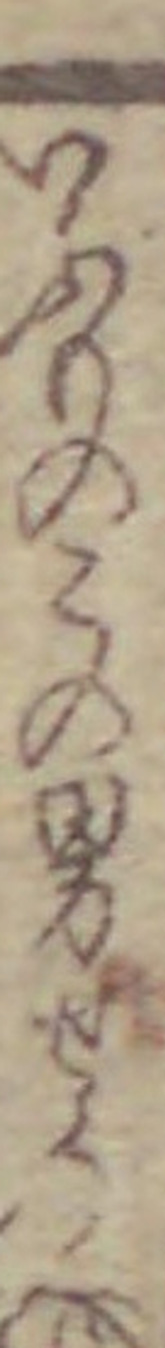いふものこの男せう
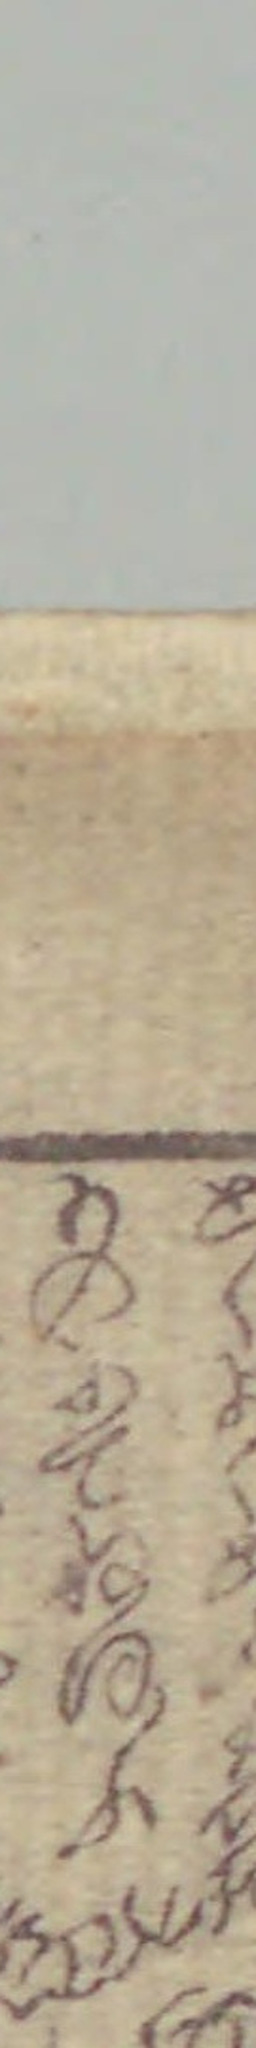ものにてねほう
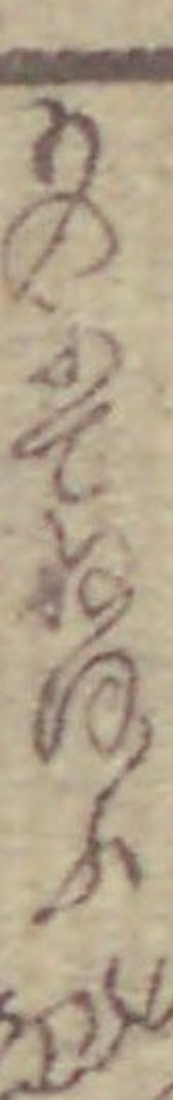ものにてねほう
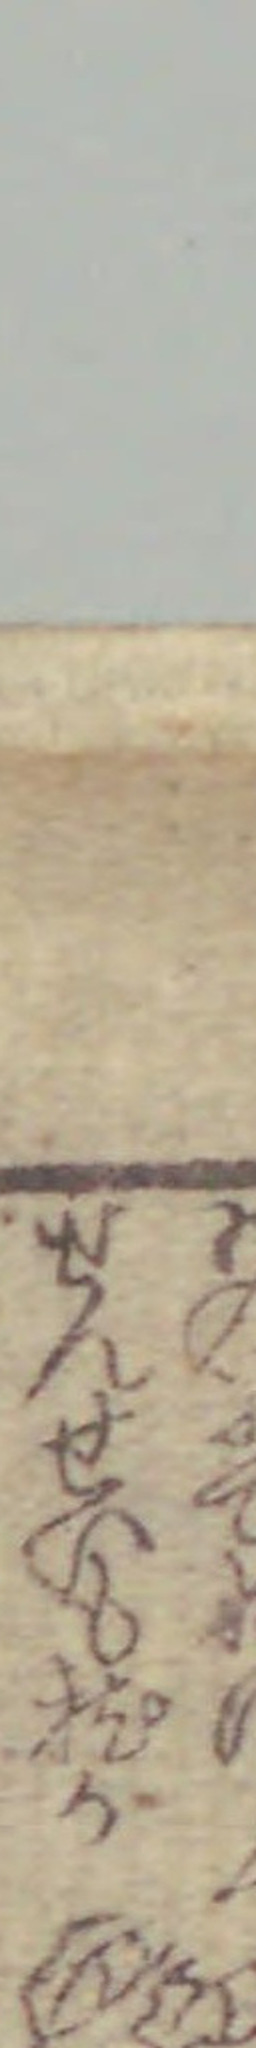せんせいも枕か
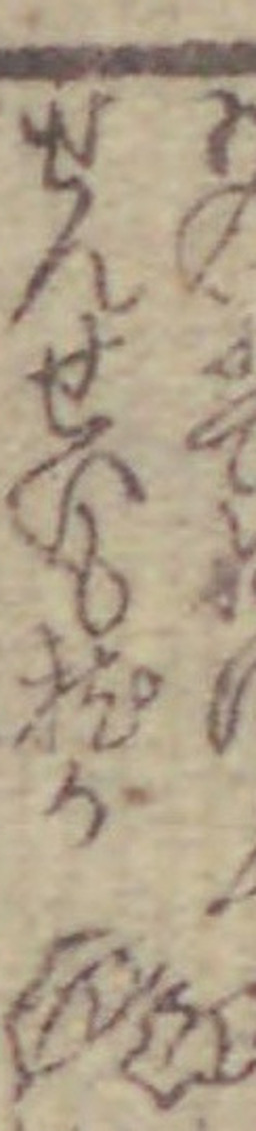せんせいも枕か
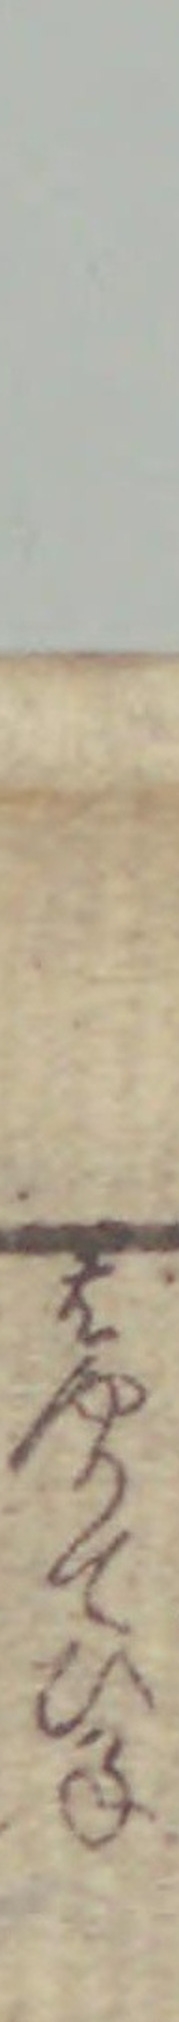はやりてひね
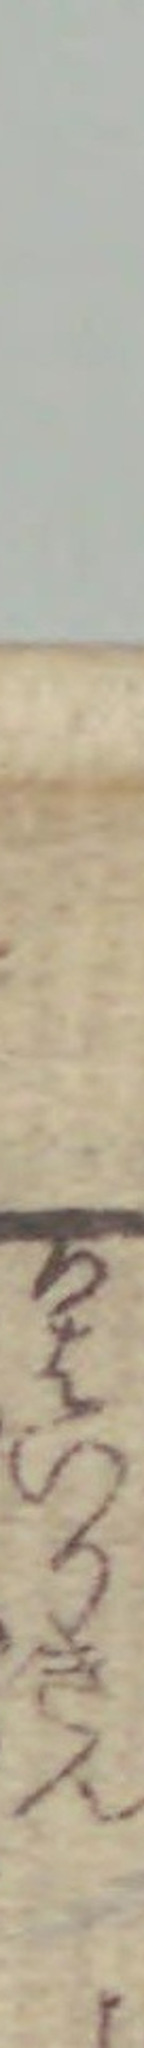かはいりきん
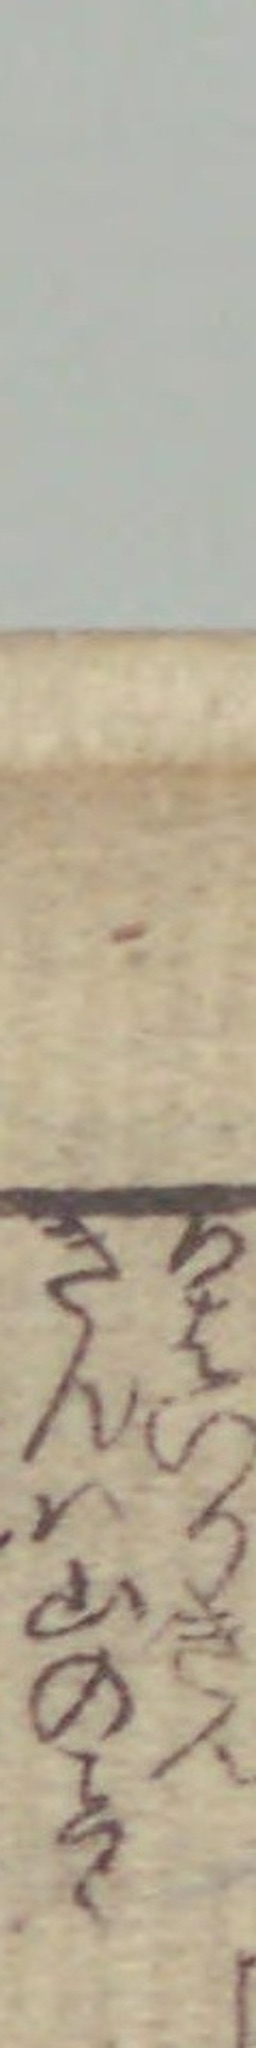きんは山のことく
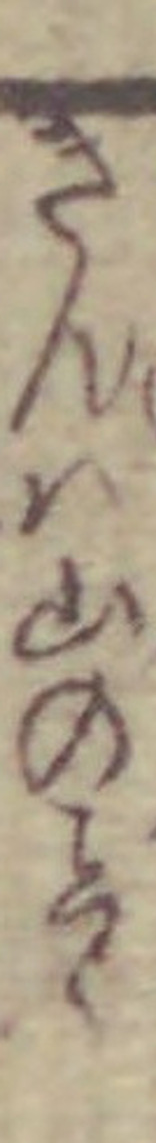きんは山のことく
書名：思事夢濃枕 3巻
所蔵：国立国会図書館 National Diet Library, JAPAN
